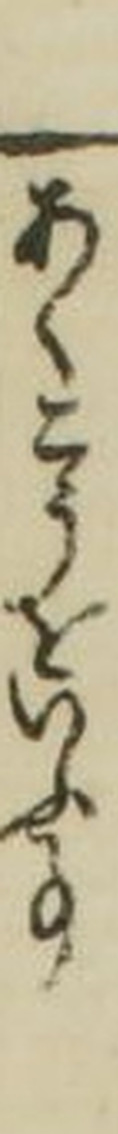あくこうをいふ事
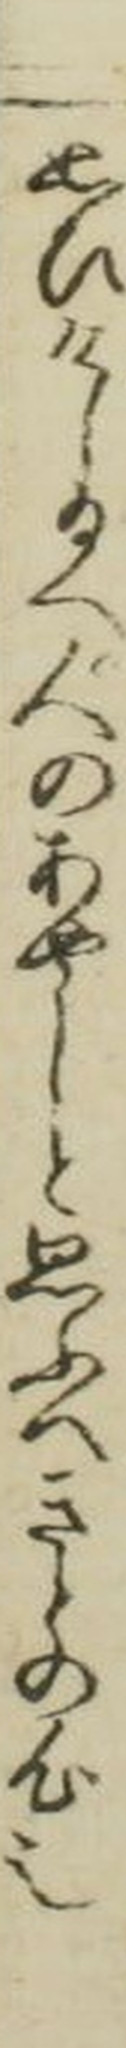思ひけし給へ。人のあやしと思ふへきとの心也
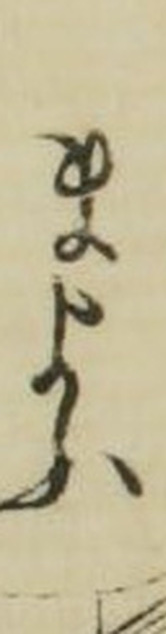まよふ
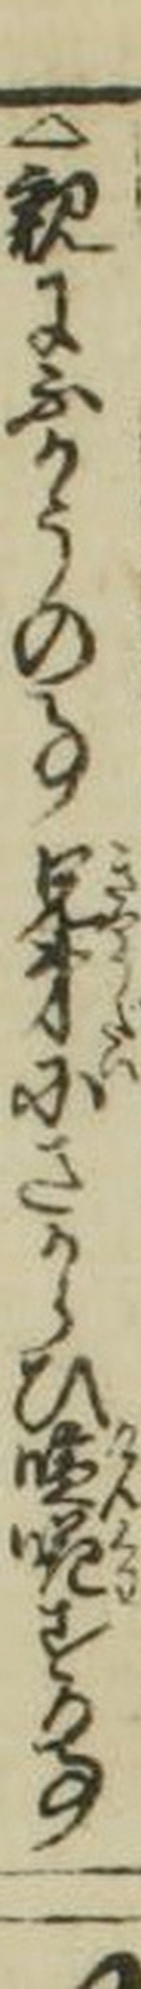△親にふかうの事兄弟にさからひ喧𠵅する事
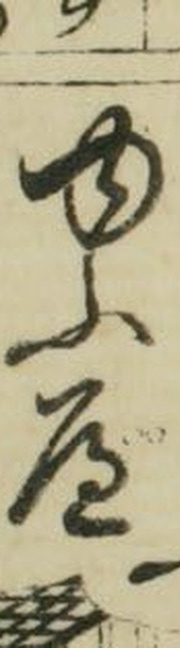ゆふべ
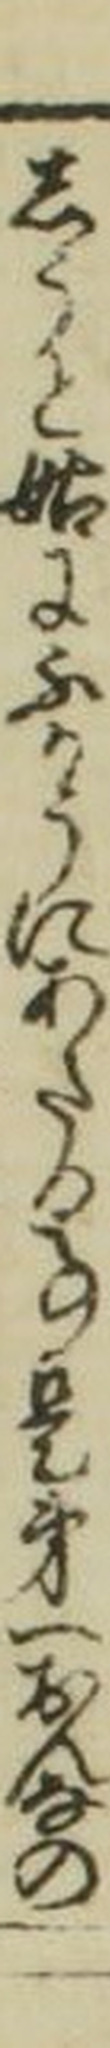しうと姑にふかうにあたる事是第一おんなの
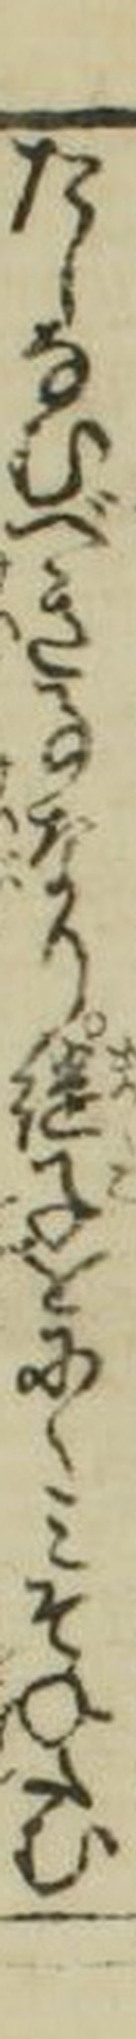たしなむべき事なり。継子をにくみそねたむ
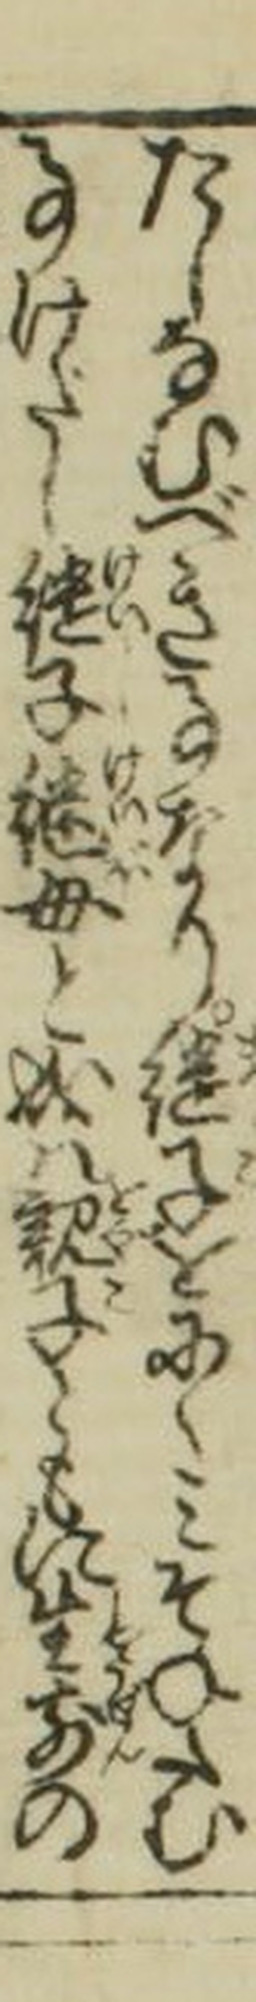事けだし継子継母と成は親子ともに生前の
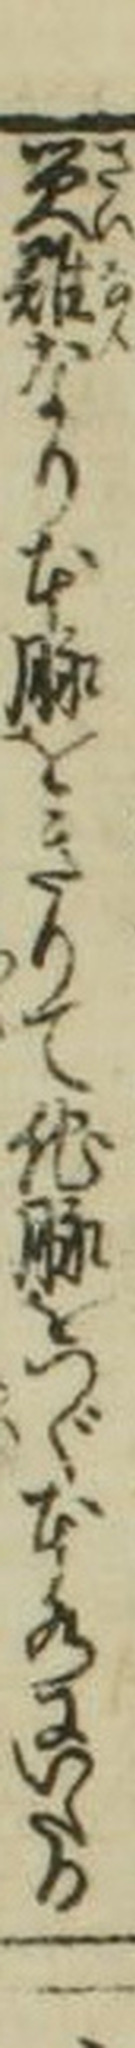災難なり本脈をきりて他脈をつぐ本水にいたる
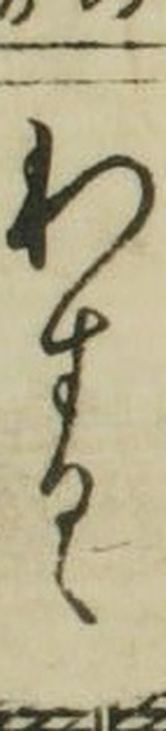わするゝ
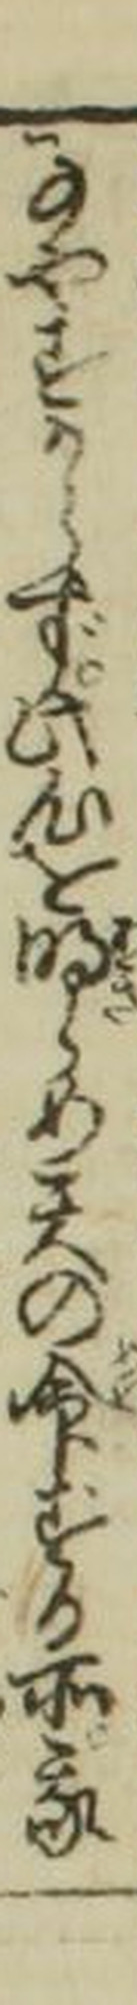事やすからず。此心を明らめ天の命ずる所。我
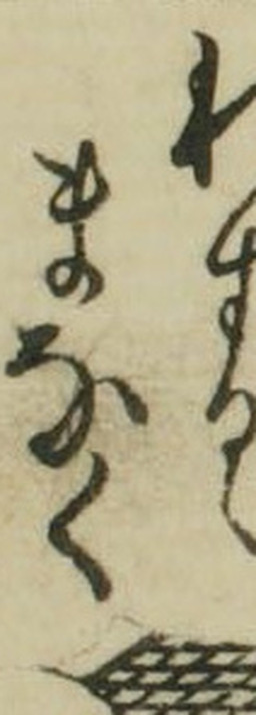まなく
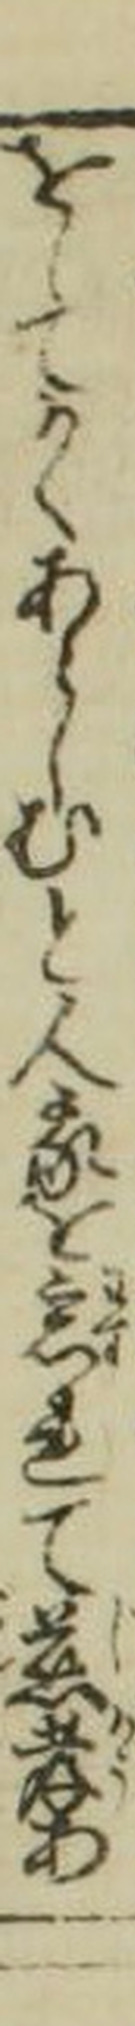をしてかくあらしむと人我を忘れて慈孝あ
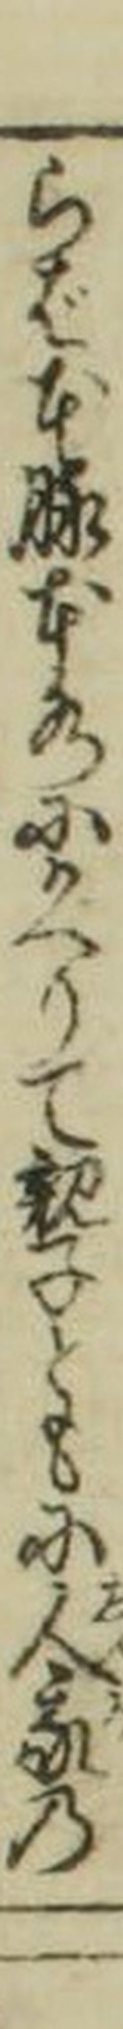らば本脈本水にかへりて親子ともに人我の
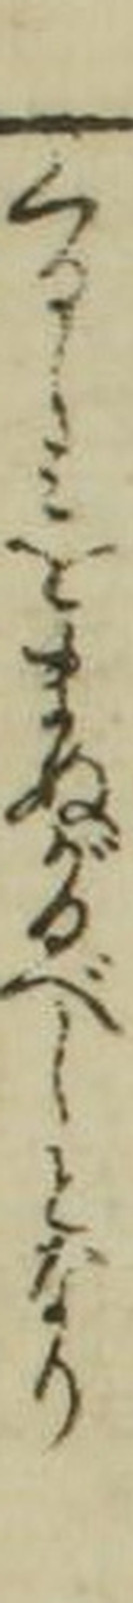くるしみをまぬがるべしとなり
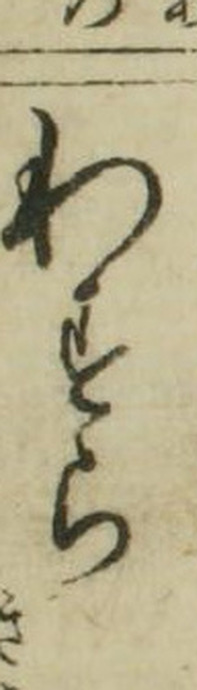わすら
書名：女源氏教訓鑑
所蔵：東京学芸大学附属図書館
